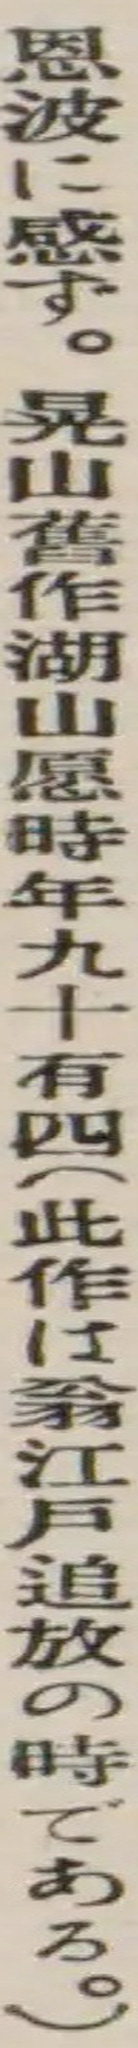恩波に感ず。晃山旧作湖山愿時年九十有四(此作は翁江戸追放の時である。)

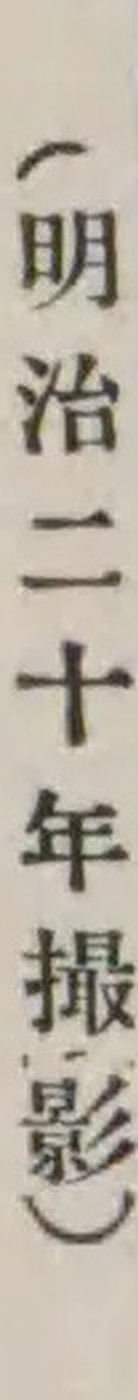(明治二十年撮影)
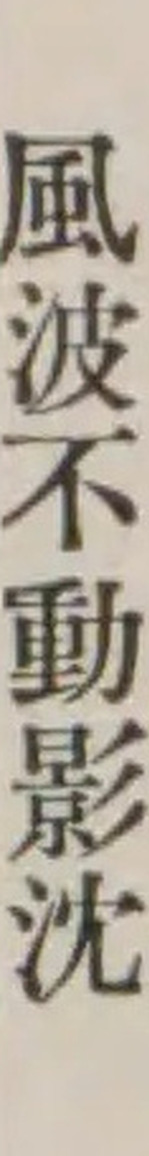風波不動影沈
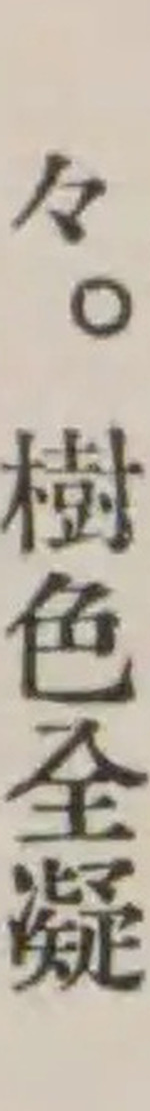々。樹色全凝
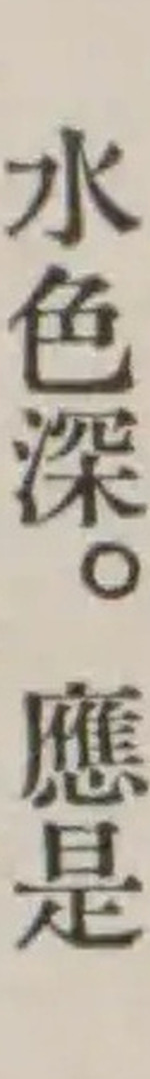水色深。応是
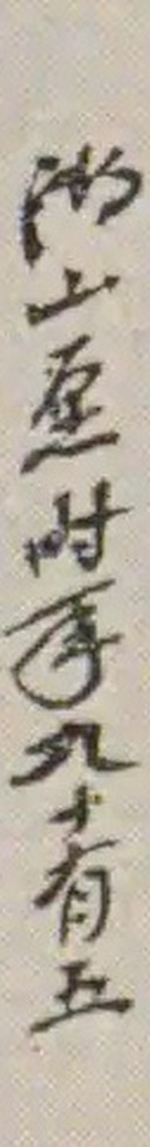湖山愿時年九十有五
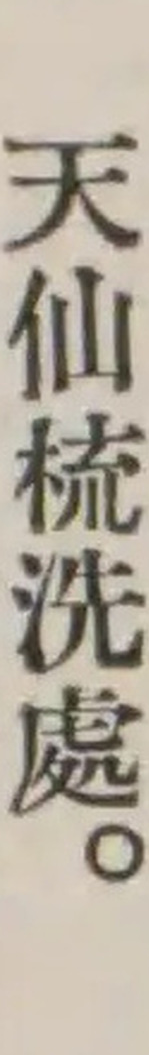天仙梳洗処。
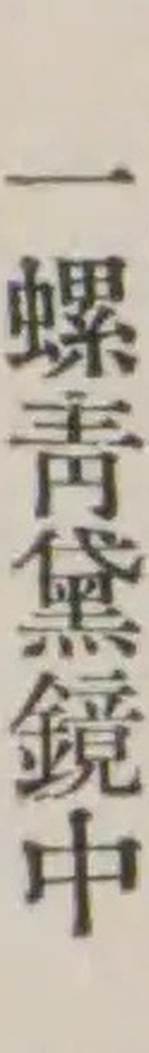一螺青黛鏡中
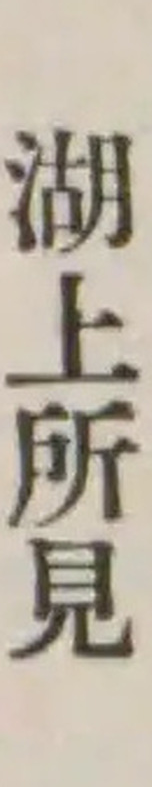湖上所見
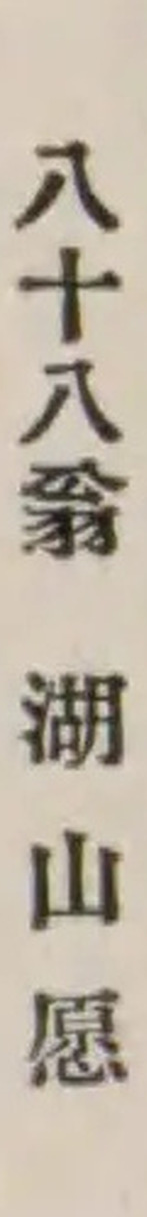八十八翁湖山愿
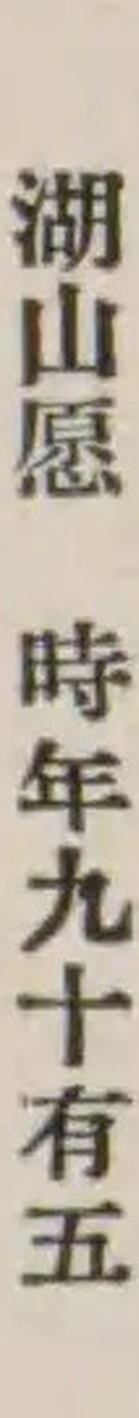湖山愿時年九十有五

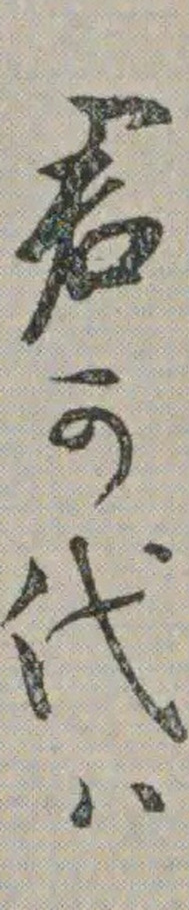君か代は
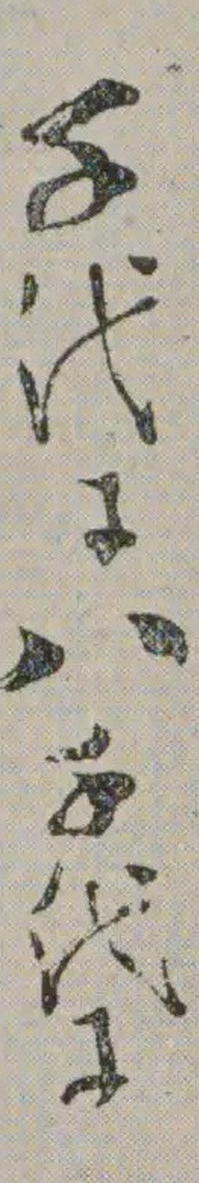千代に八千代に
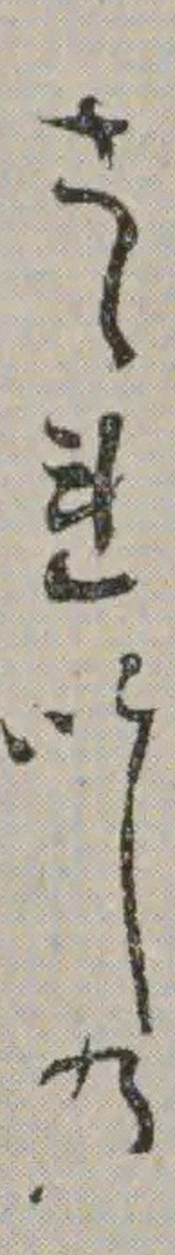さゝれいしの
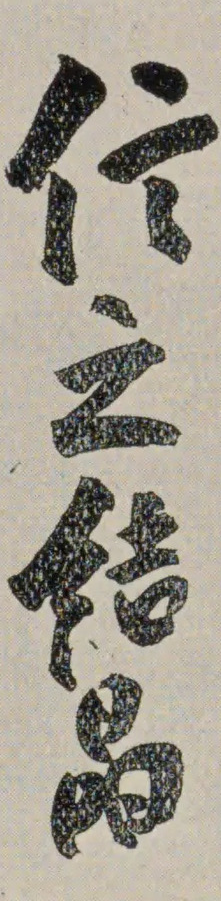信之結晶
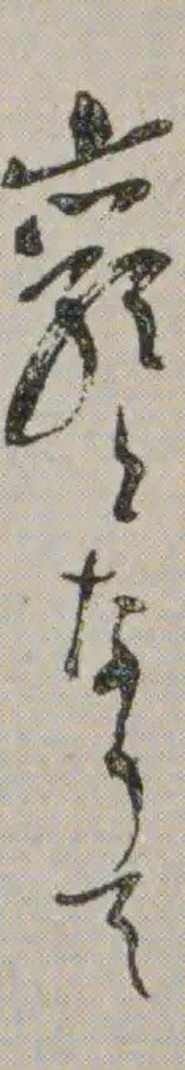巌となりて
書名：小野湖山翁小伝
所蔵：国立国会図書館 National Diet Library, JAPAN
